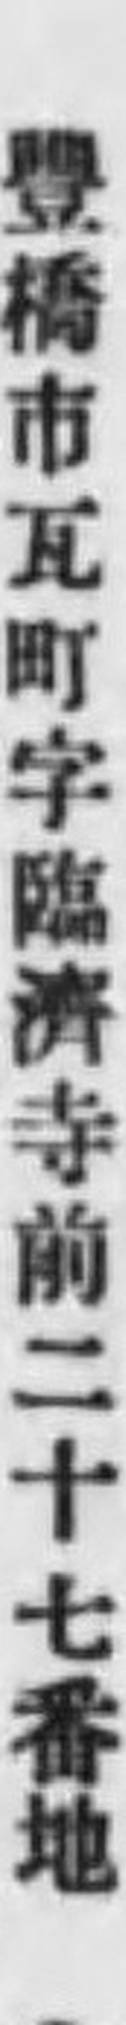豊橋市瓦町字臨済寺前二十七番地
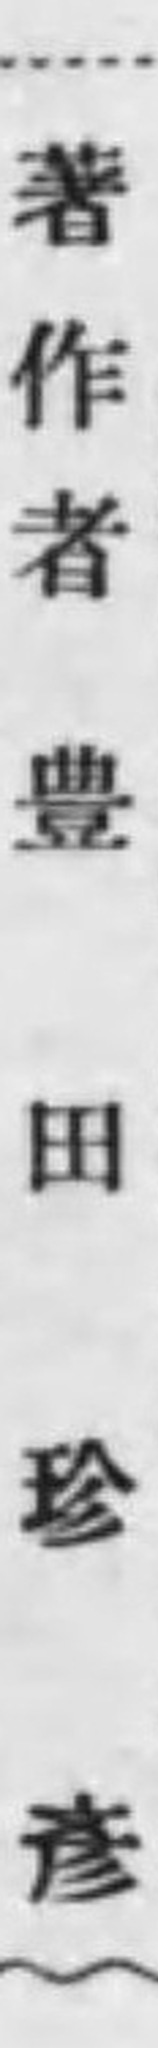著作者豊田珍彦
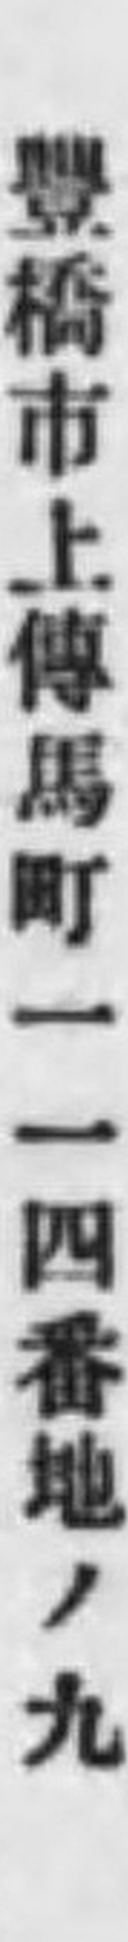豊橋市上伝馬町一一四番地ノ九
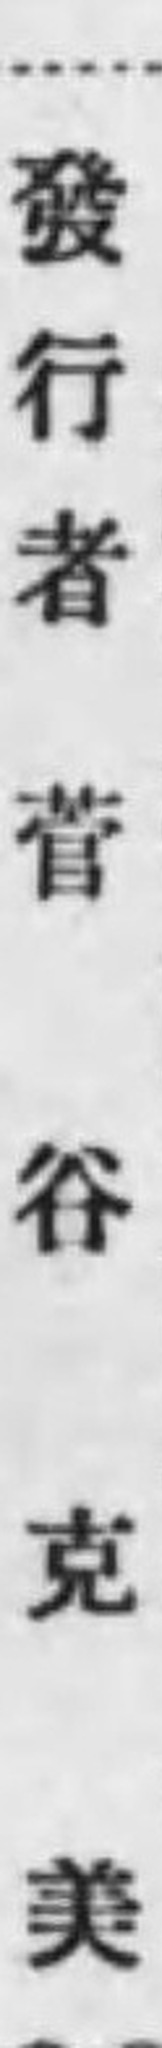発行者菅谷克美
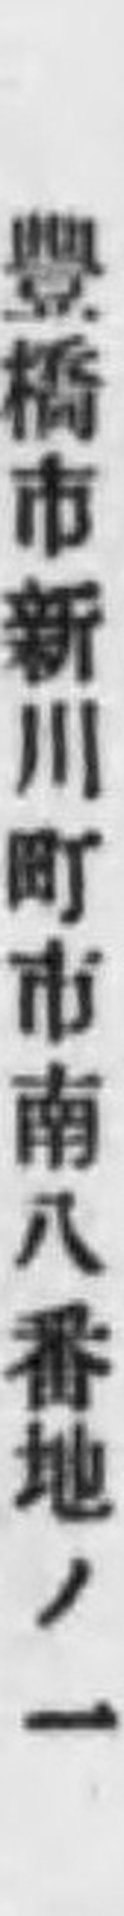豊橋市新川町市南八番地ノ一
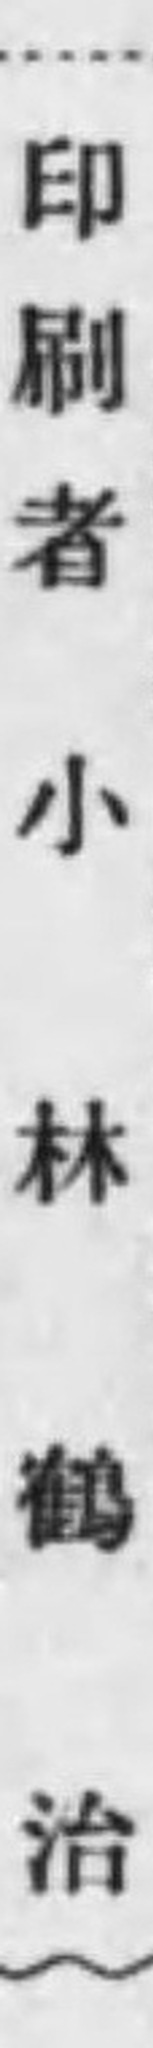印刷者小林鶴治
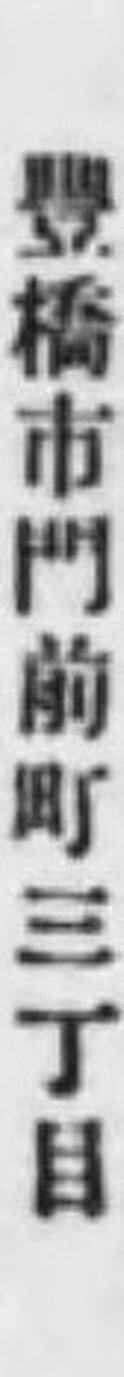豊橋市門前町三丁目
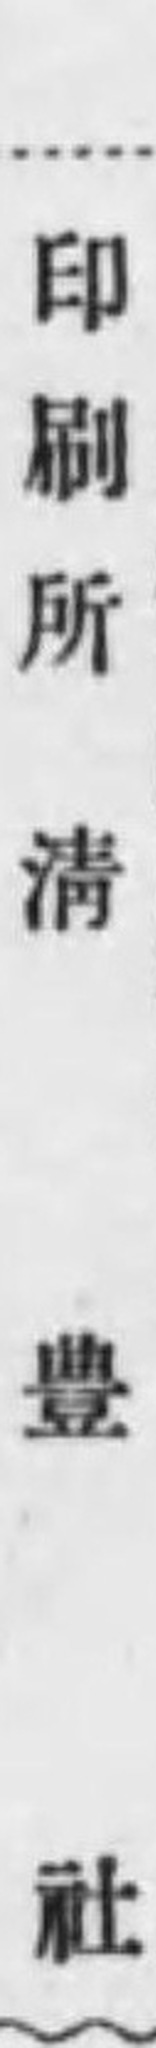印刷所清豊社
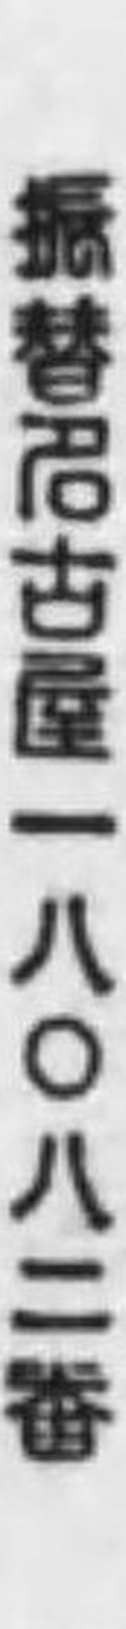振替名古屋一八〇八二番
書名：東三河道中記 : 豊橋市及其附近案内
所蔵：国立国会図書館 National Diet Library, JAPAN
